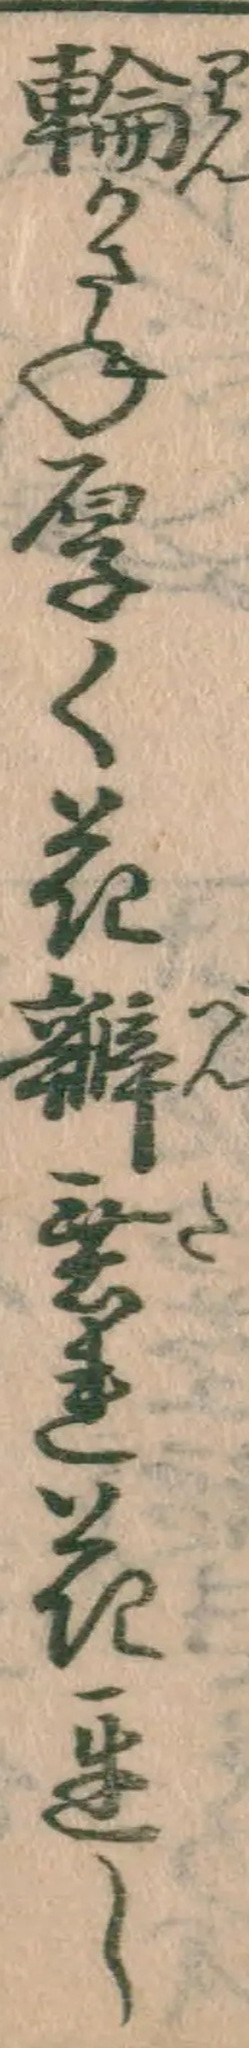輪かさね厚く花弁垂れ花遅し
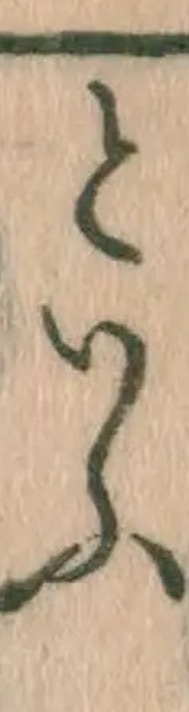といふ
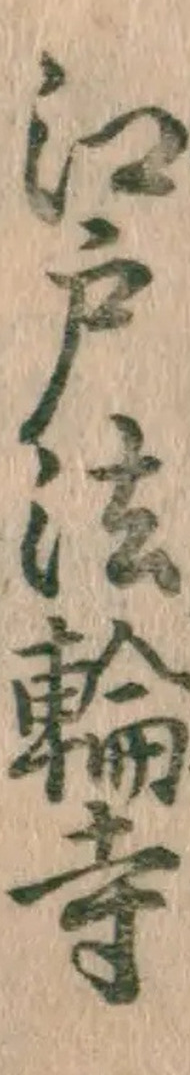江戸法輪寺
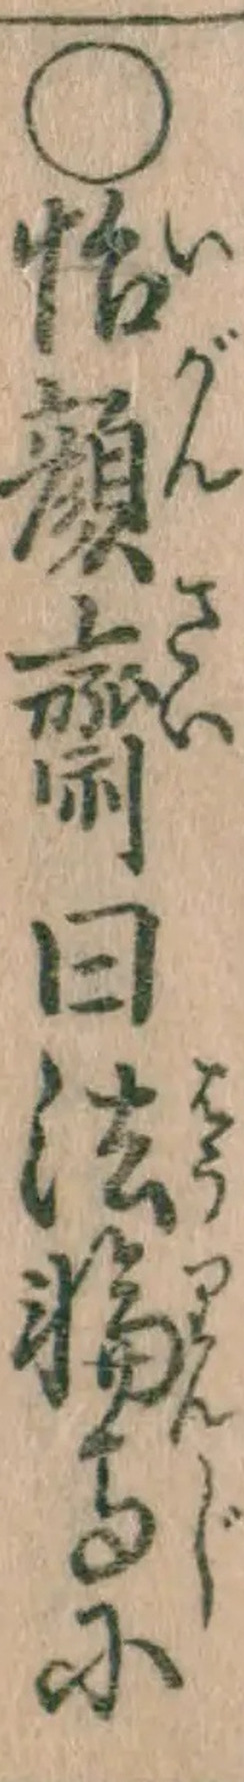○怡顔斎曰法輪寺に
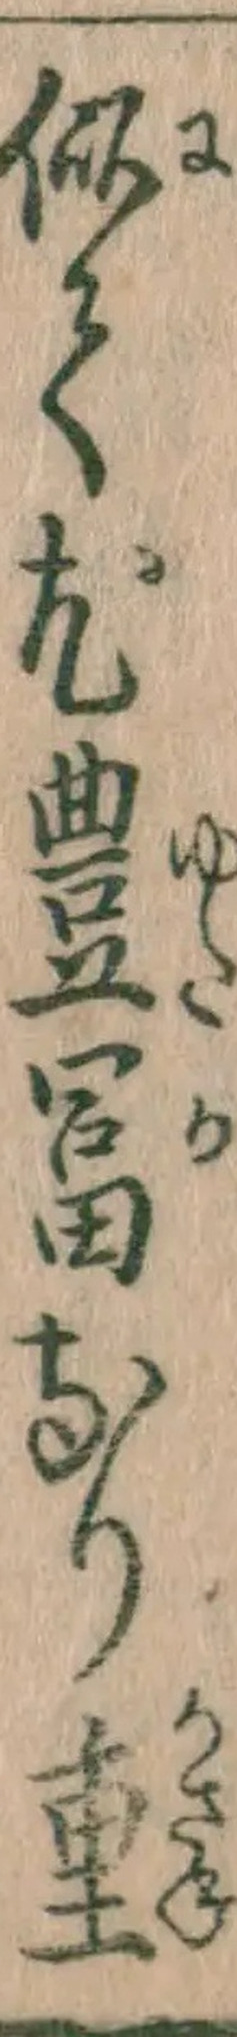似て尤豊富なり重
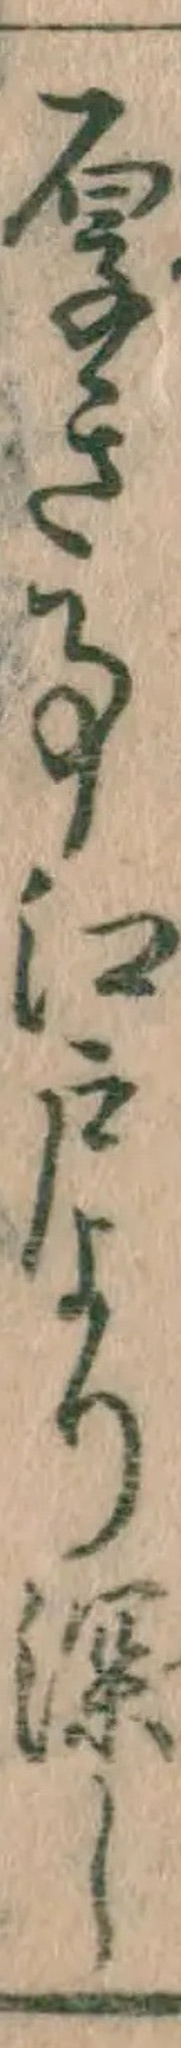厚き事江戸より深し
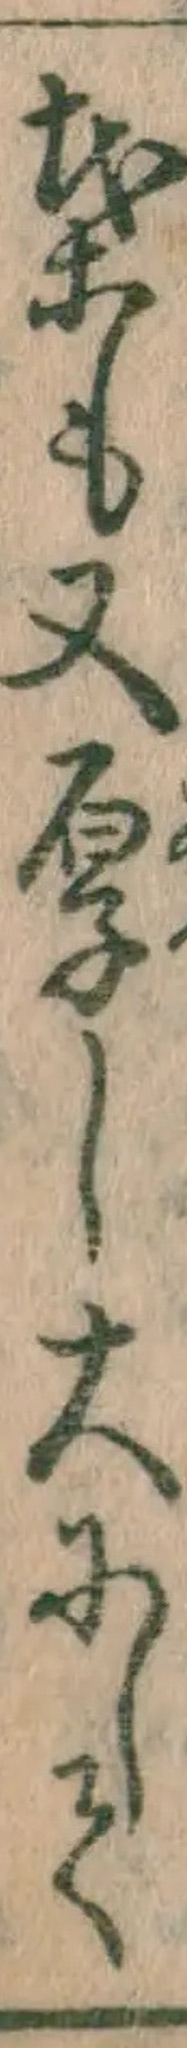葉も又厚し大にして
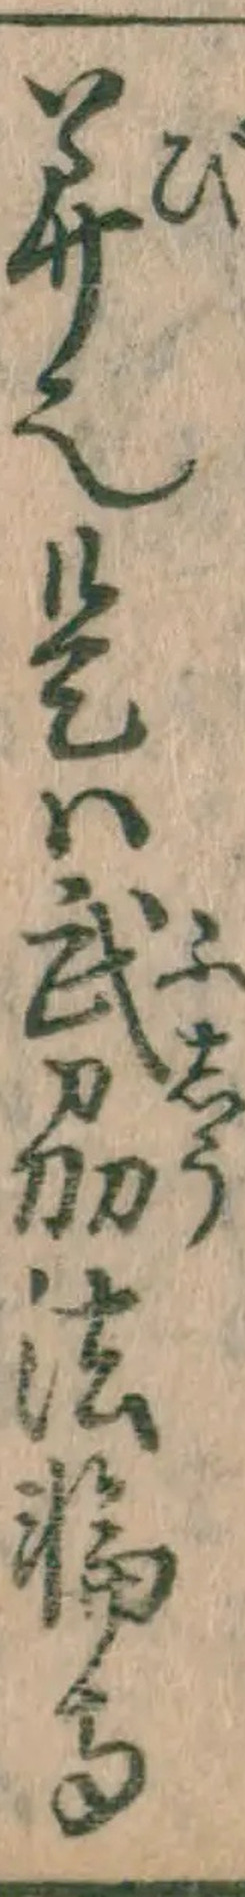美也是は武州法輪寺
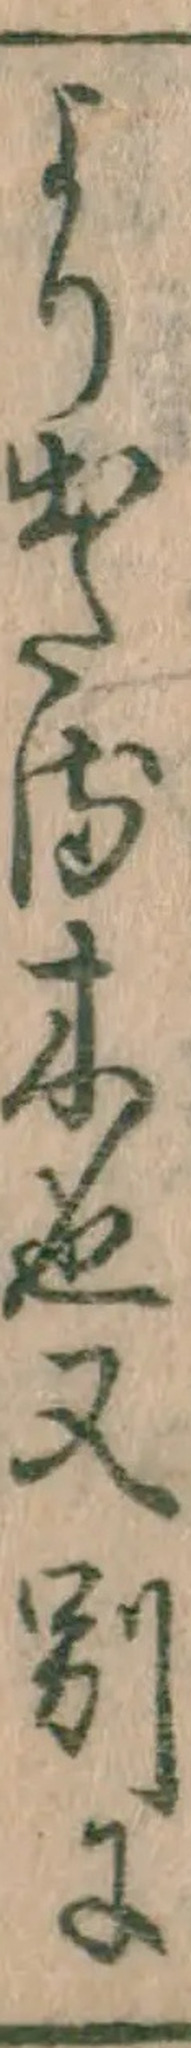より出たる木也又別に
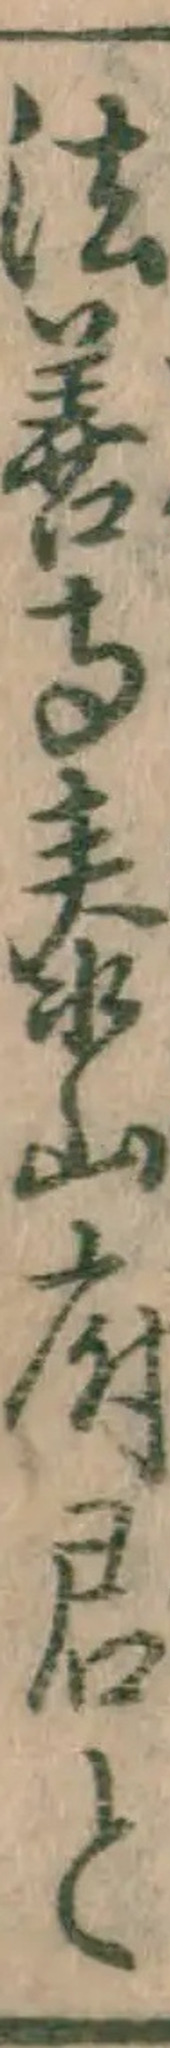法善寺泰山府君と

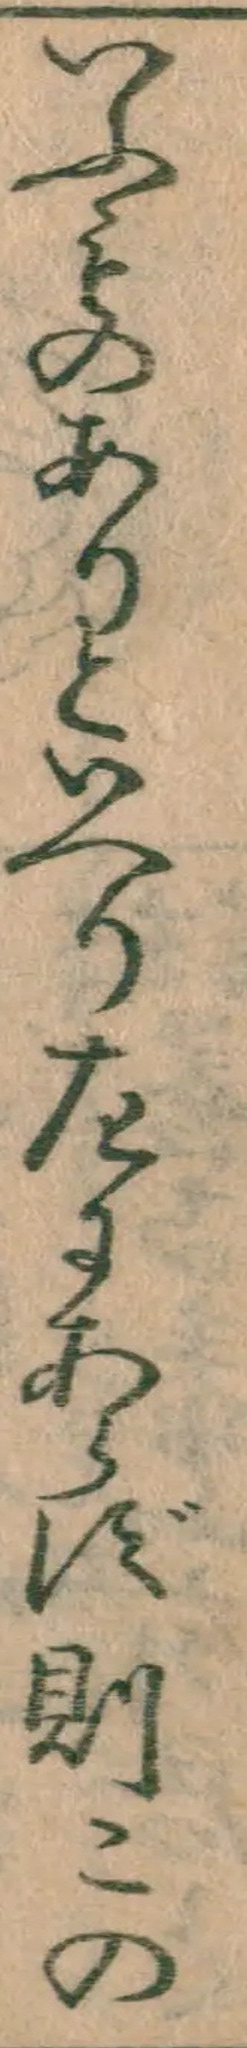いふものありといへり左にあらず則この
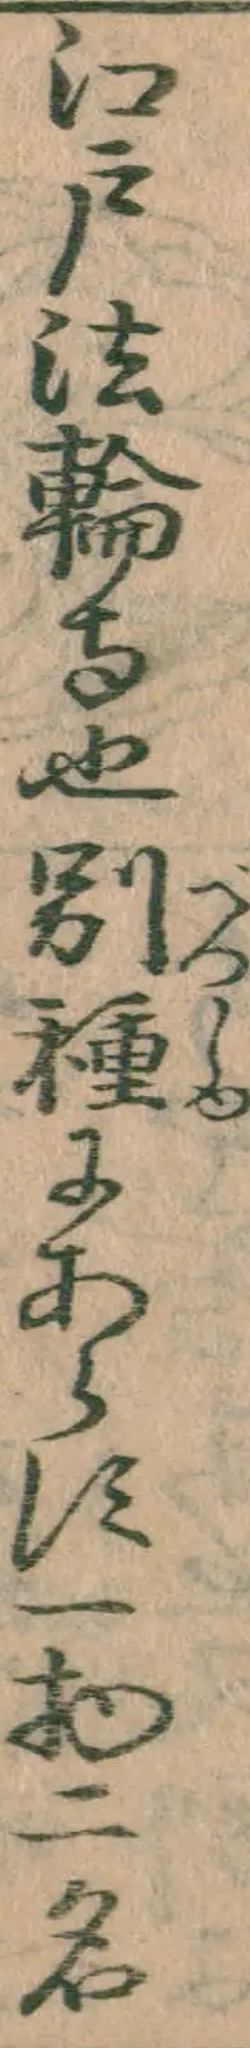江戸法輪寺也別種にあらす一物二名
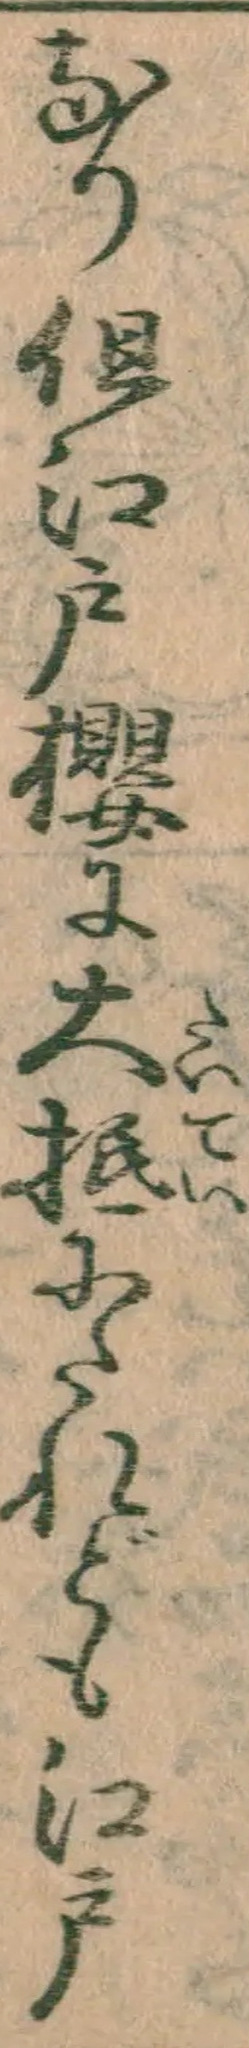なれ但江戸桜に大抵にたれども江戸
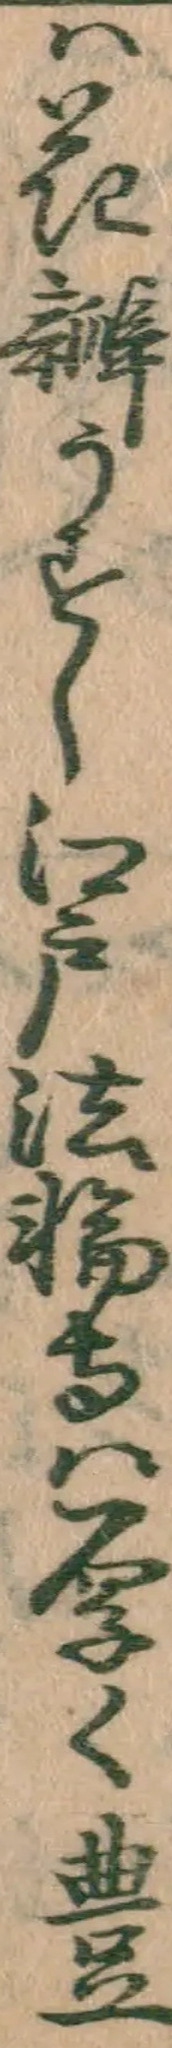は花弁うすし江戸法輪寺は厚く豊
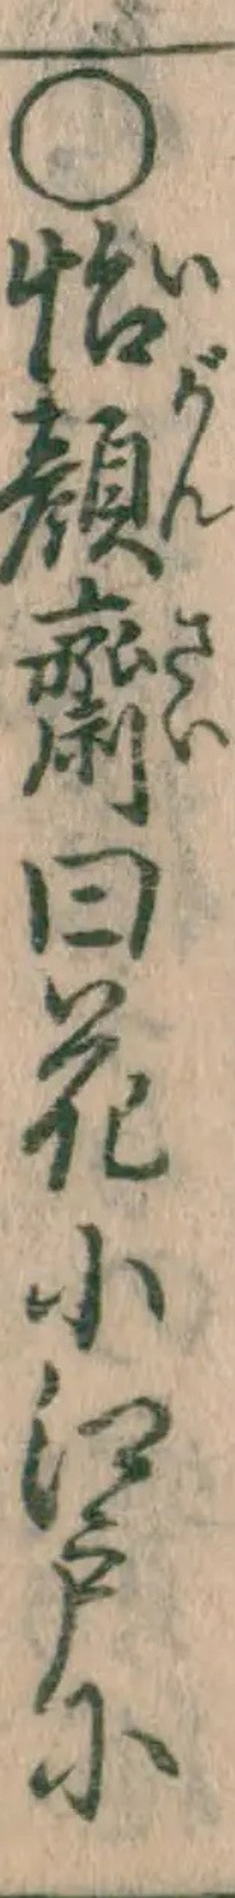○怡顔斎曰花小江戸に
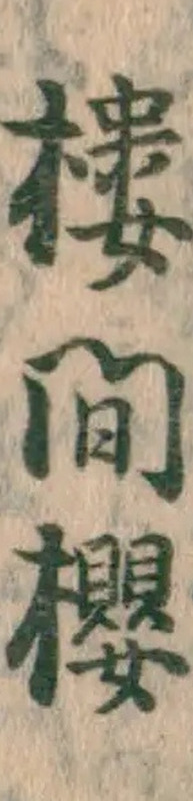楼間桜
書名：怡顔齋櫻品
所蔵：国立国会図書館 National Diet Library, JAPAN
